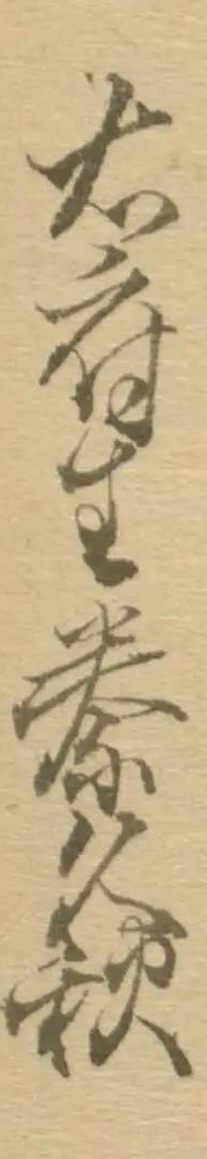右府生秦久秋

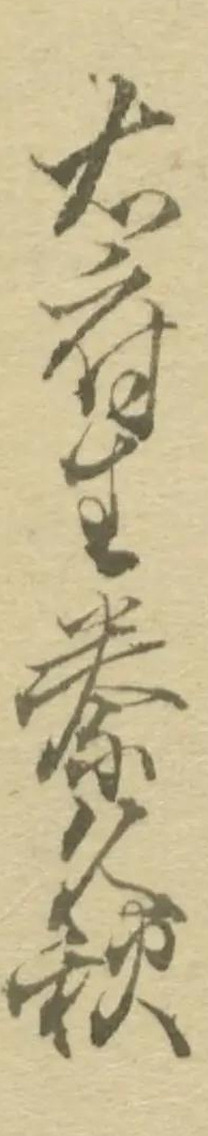右府生秦久秋
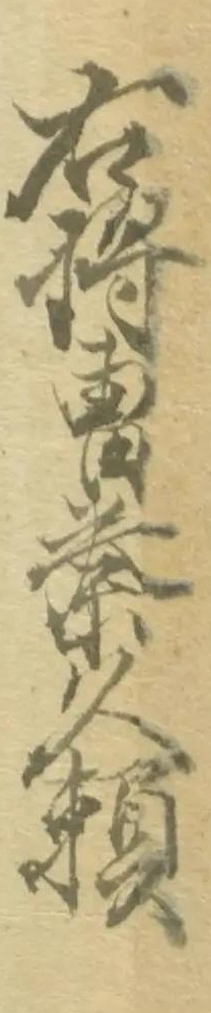右将曹秦久頼

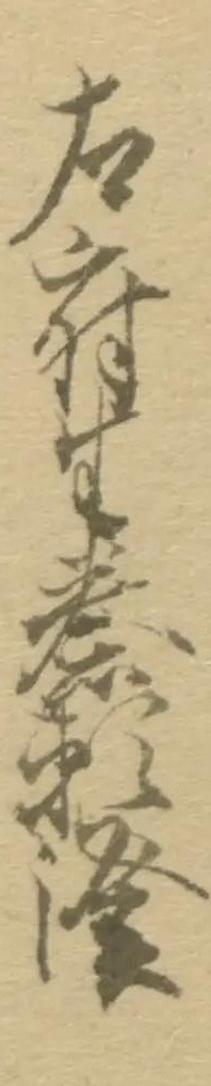右府生秦頼澄
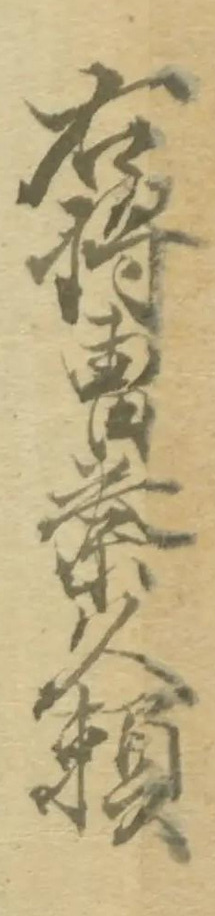右将曹秦久頼

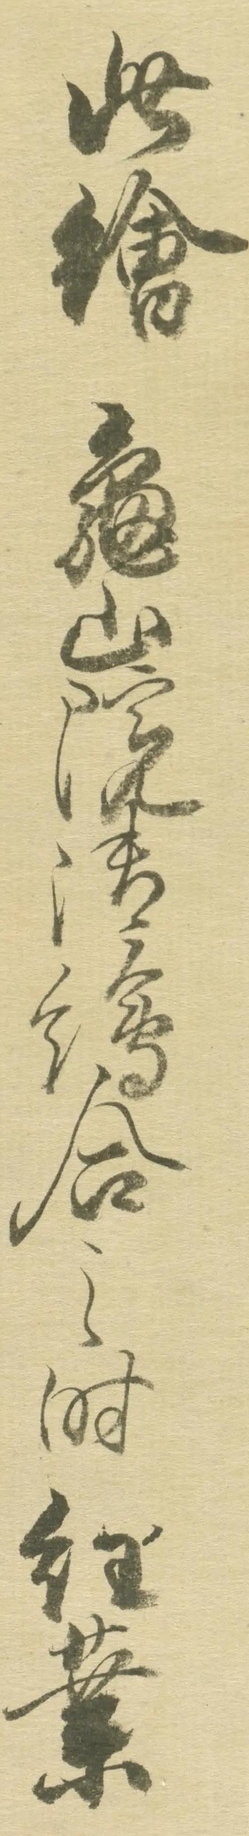此絵亀山院御絵合之時経業
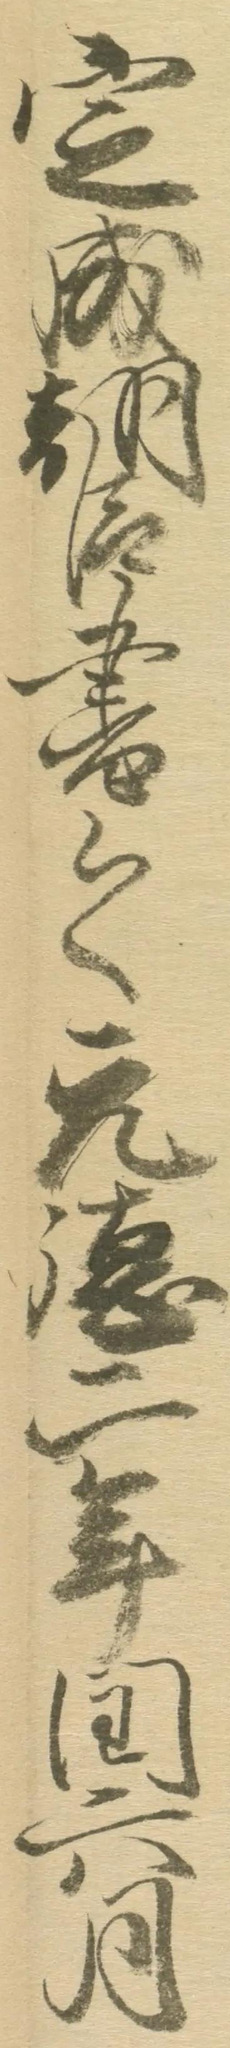定成朝臣書之元徳二年閏六月
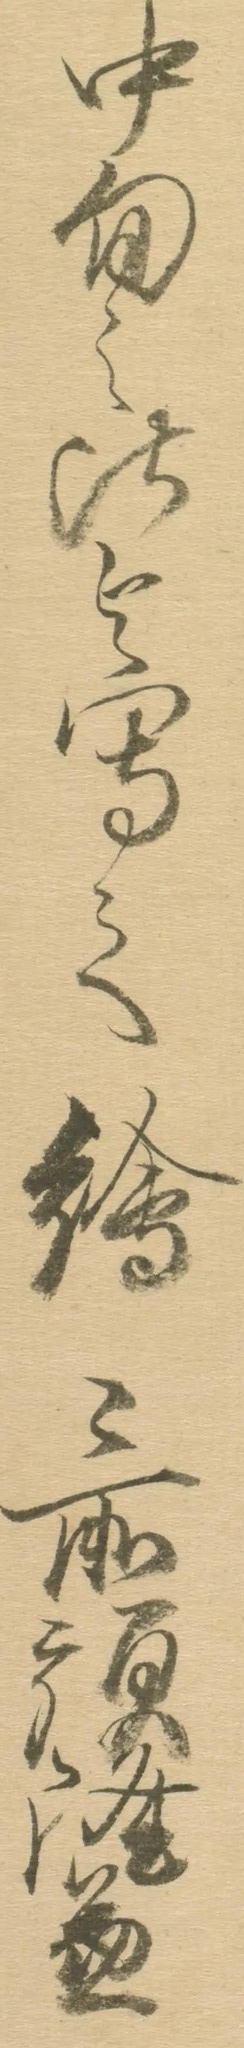中旬之比令写之絵々所預隆兼

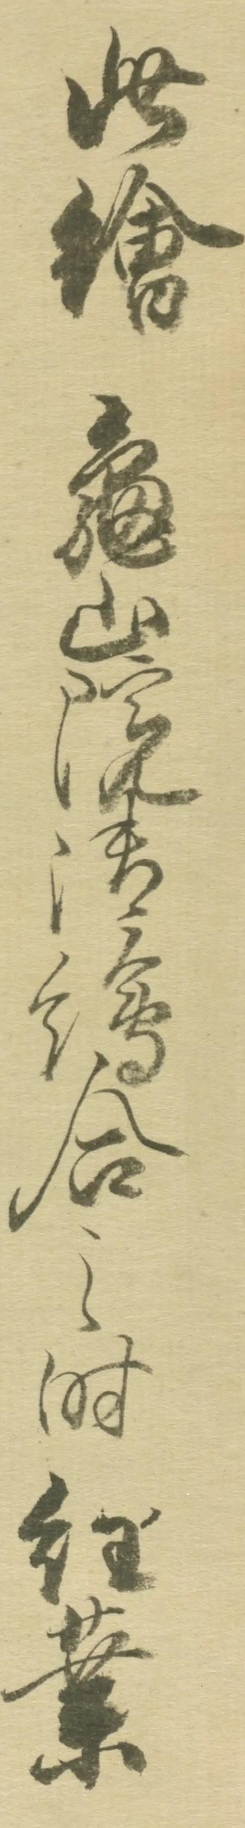此絵亀山院御絵合之時経業
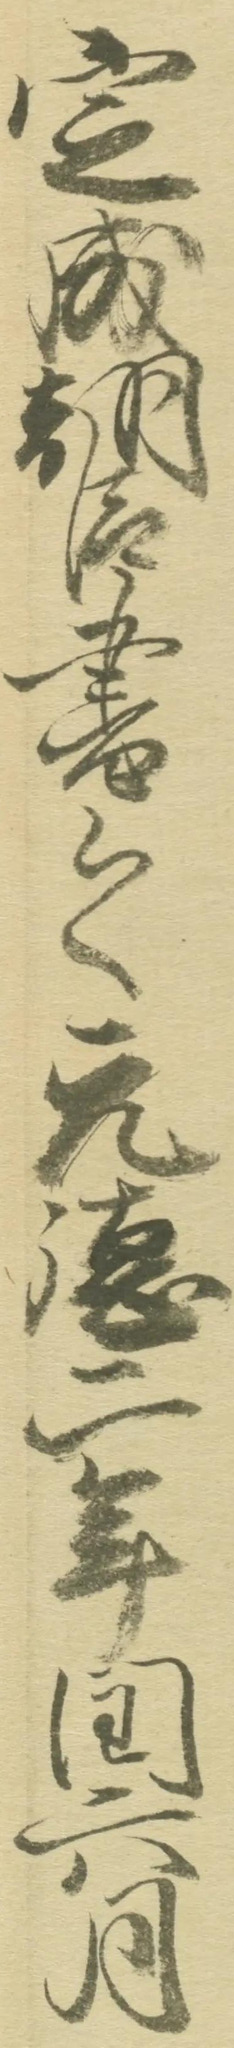定成朝臣書之元徳二年閏六月
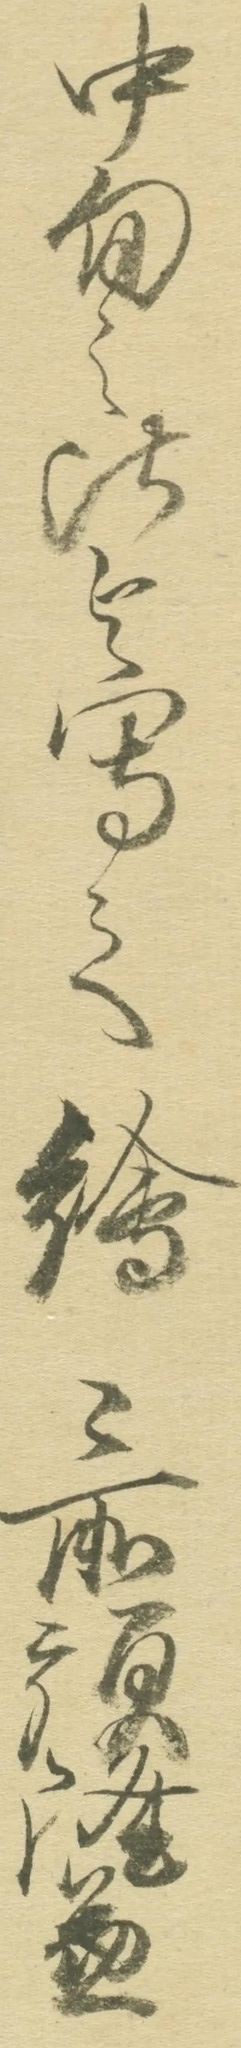中旬之比令写之絵々所預隆兼
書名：賀茂祭縁起
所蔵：国立国会図書館 National Diet Library, JAPAN
